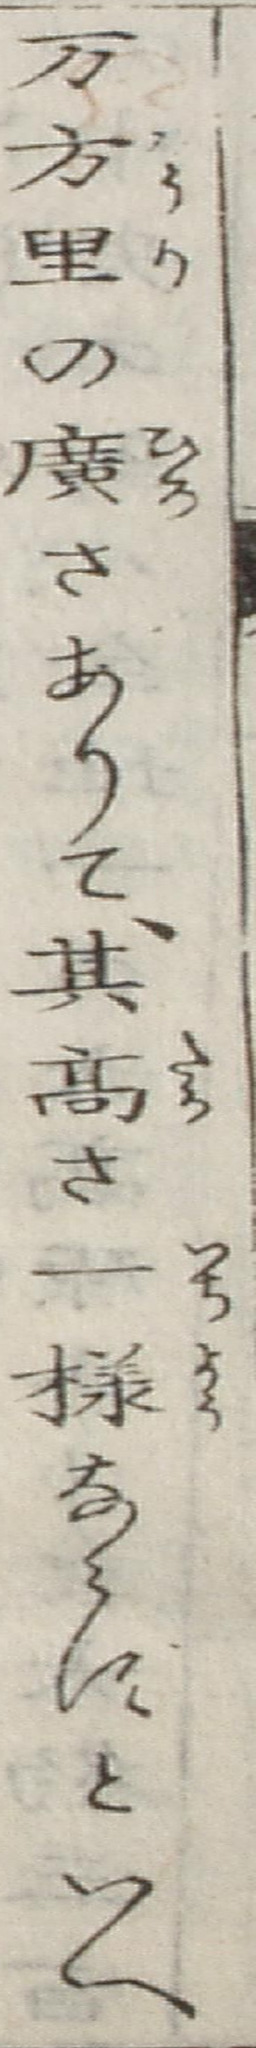万方里の広さありて、其高さ一様ならすといへ
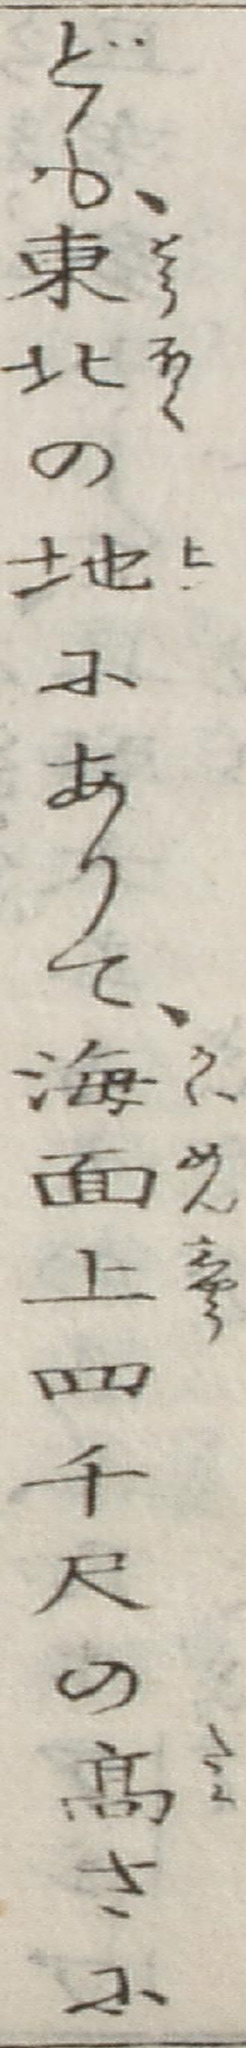ども、東北の地にありて、海面上四千尺の高さに
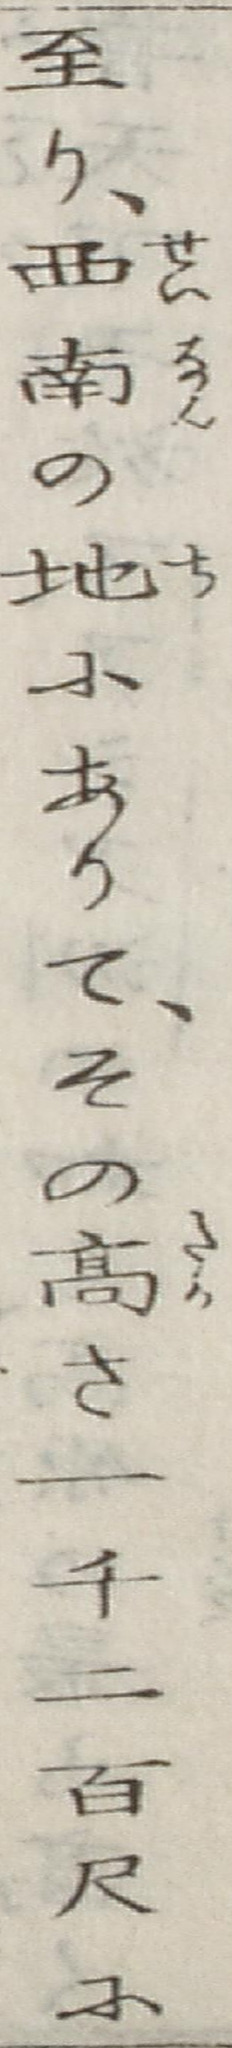至り、西南の地にありて、その高さ一千二百尺に

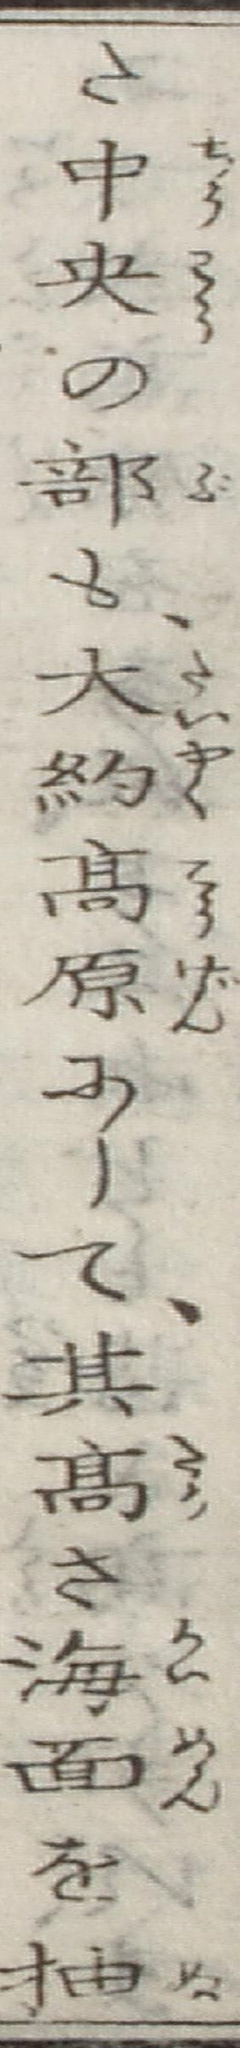た中央の部も、大約高原にして、其高さ海面を抽
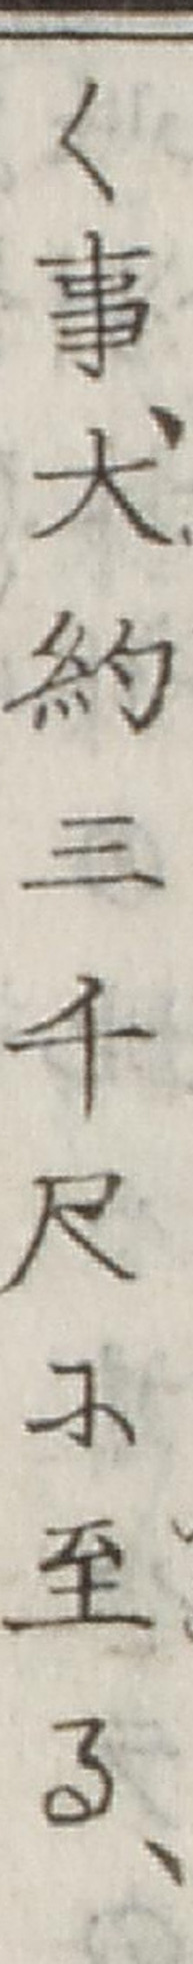く事、大約三千尺に至る、
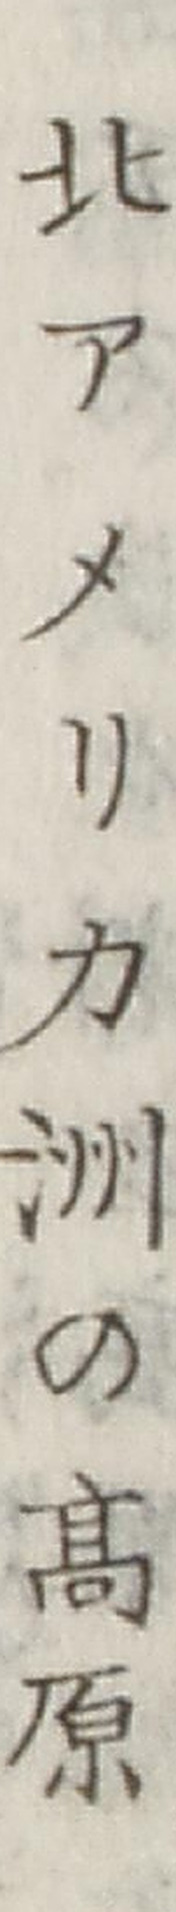北アメリカ洲の高原
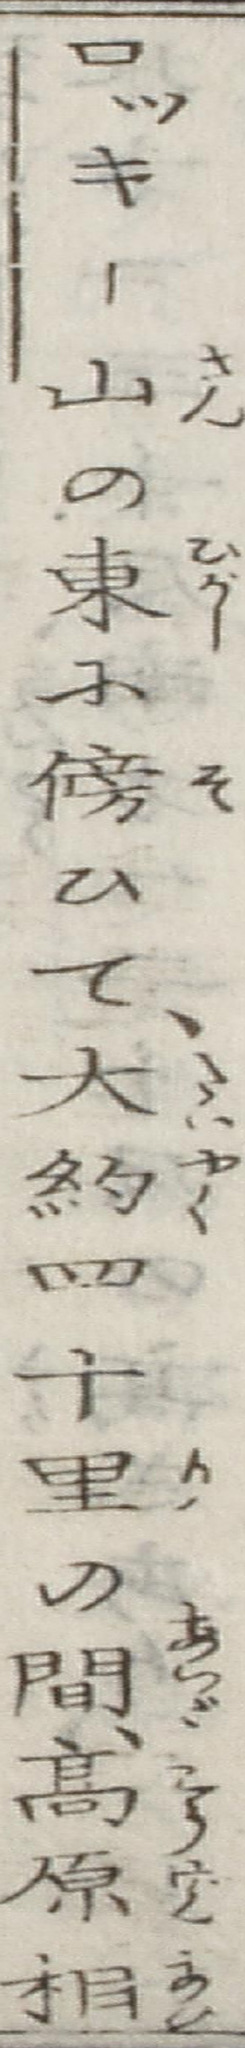ロッキー山の東に傍ひて、大約四十里の間、高原相
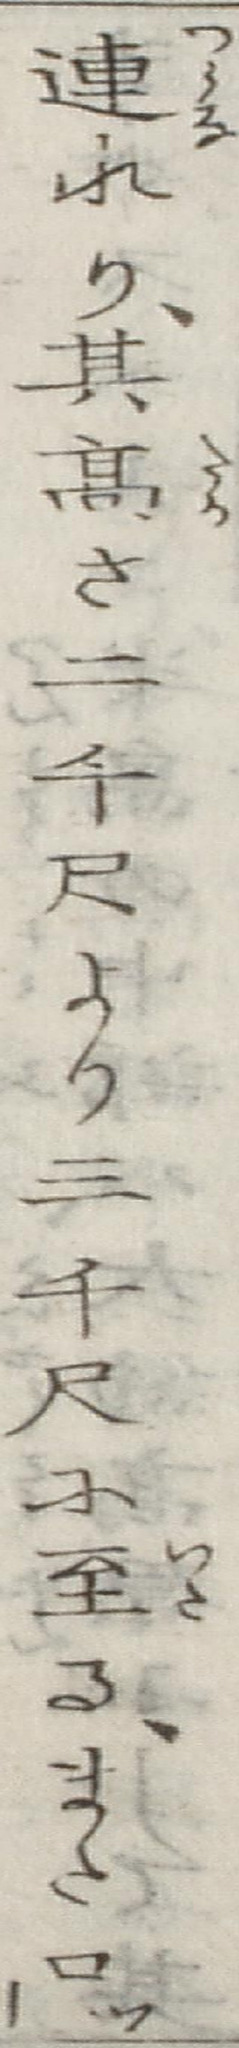連れり、其高さ二千尺より三千尺に至る、またロッ
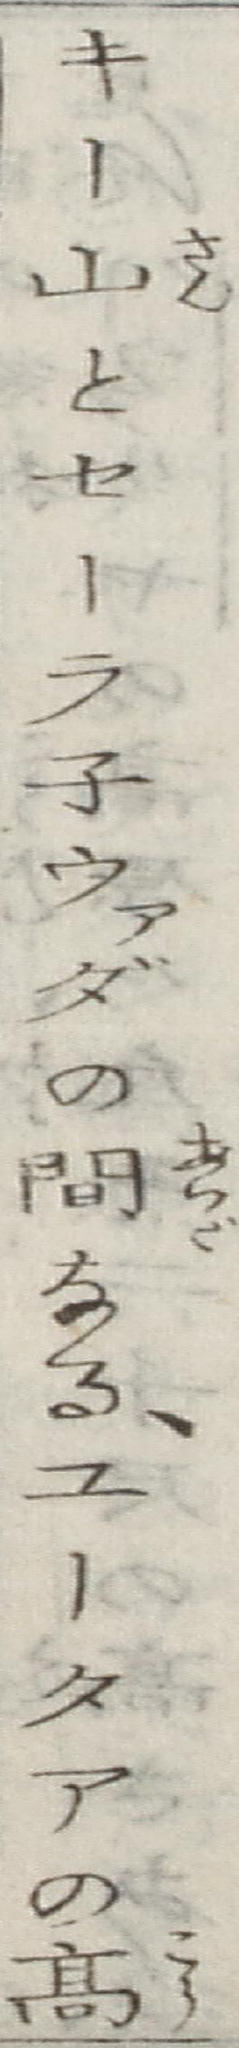キー山とセーラネウァダの間なる、ユータアの高
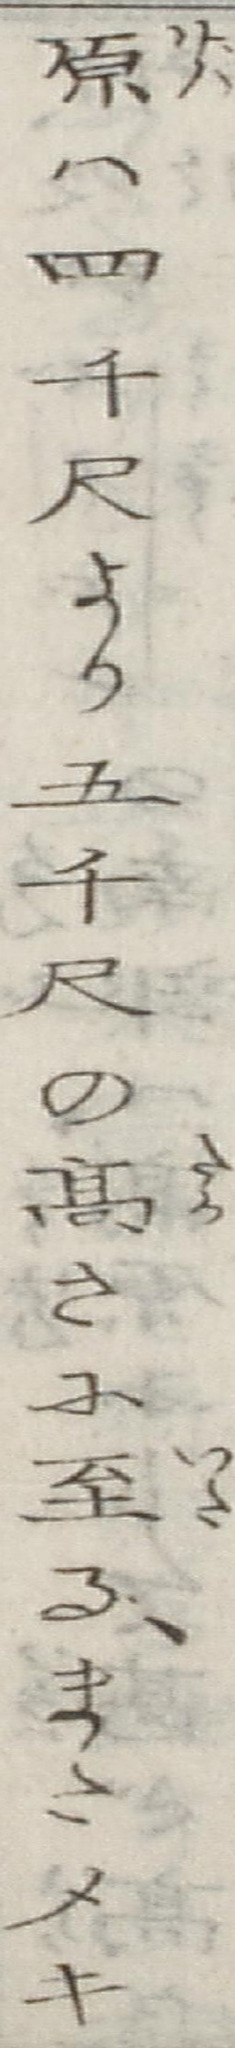原は四千尺より五千尺の高さに至る、またメキ
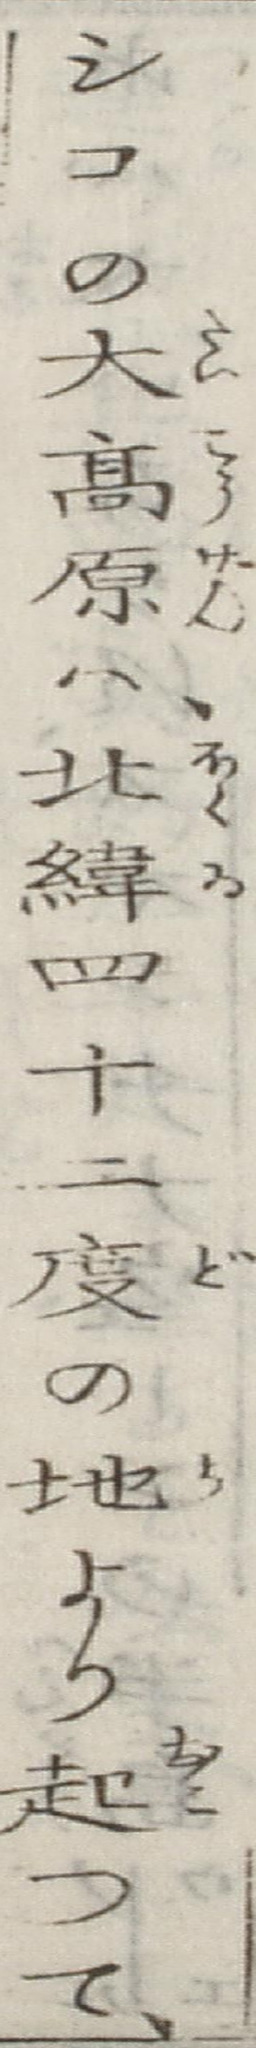シコの大高原は、北緯四十二度の地より起つて、
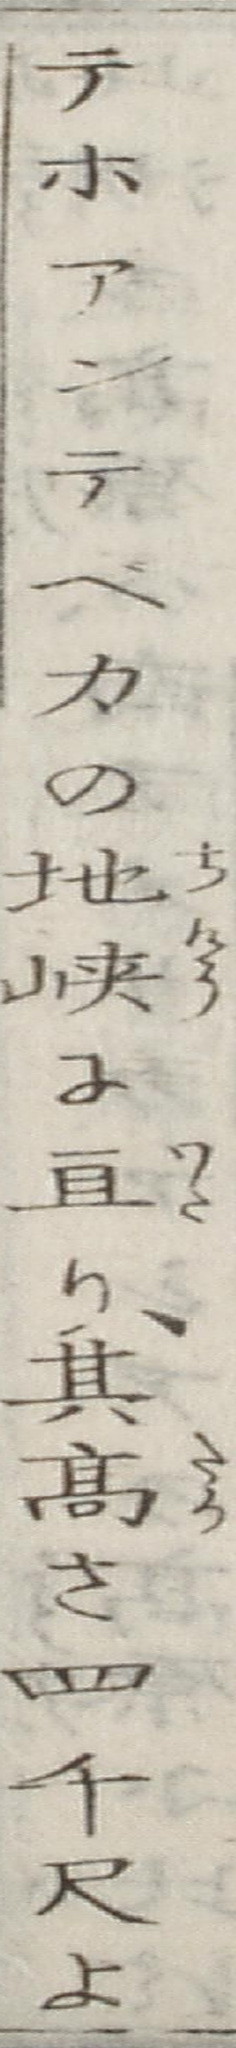テホアンテへカの地峡に亘り、其高さ四千尺よ
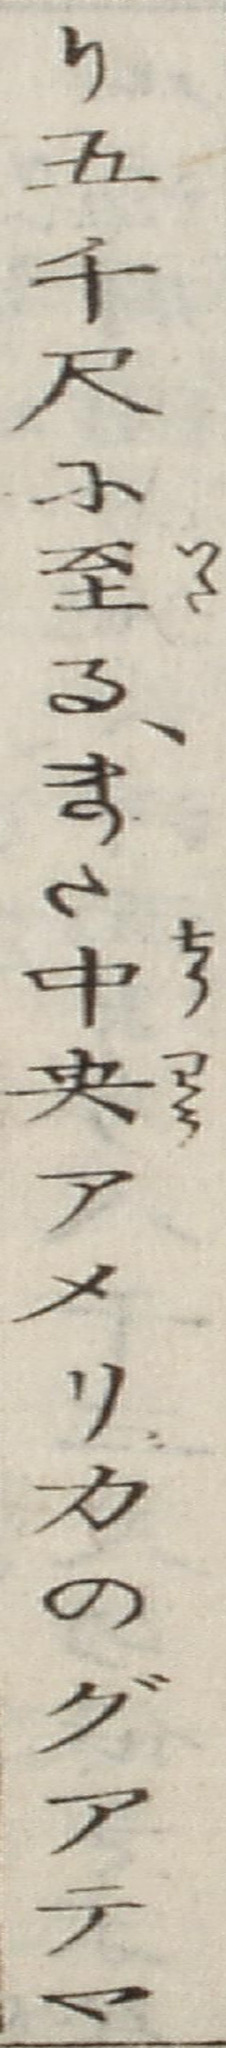り五千尺に至る、また中央アメリカのグアテマ
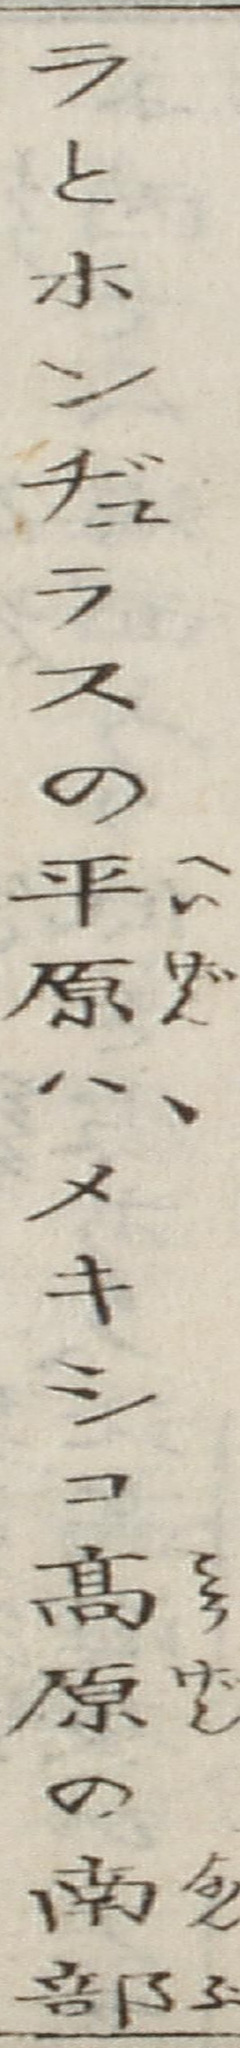ラとホンヂュラスの平原は、メキシコ高原の南部
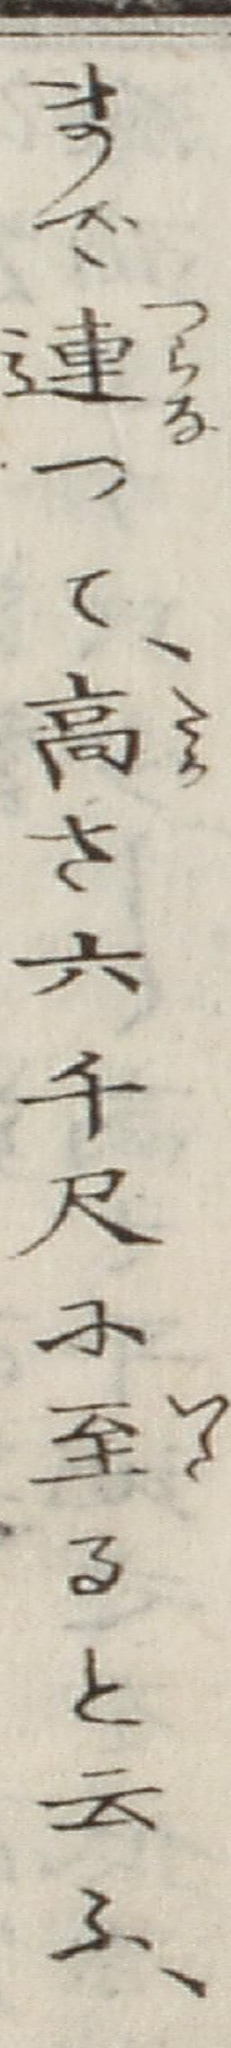まで連つて、高さ六千尺に至ると云ふ、
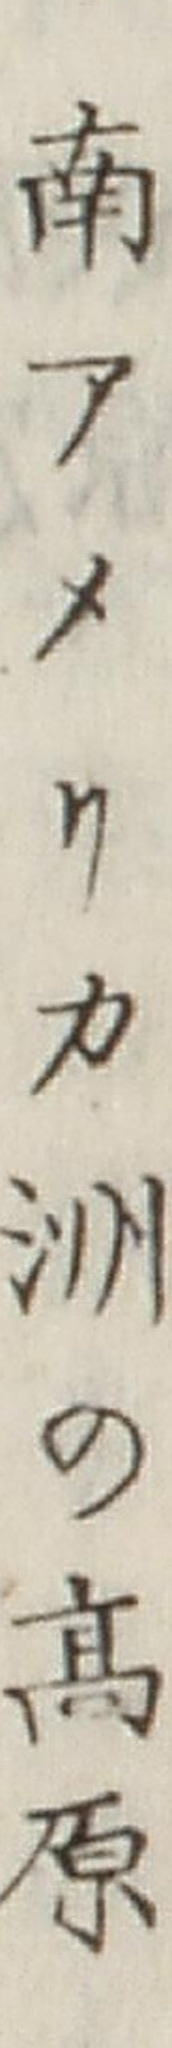南アメリカ洲の高原
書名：訓蒙　天然地理學　上
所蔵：東京大学地震研究所図書室 Earthquake Research Institute Library, The University of Tokyo, JAPAN
